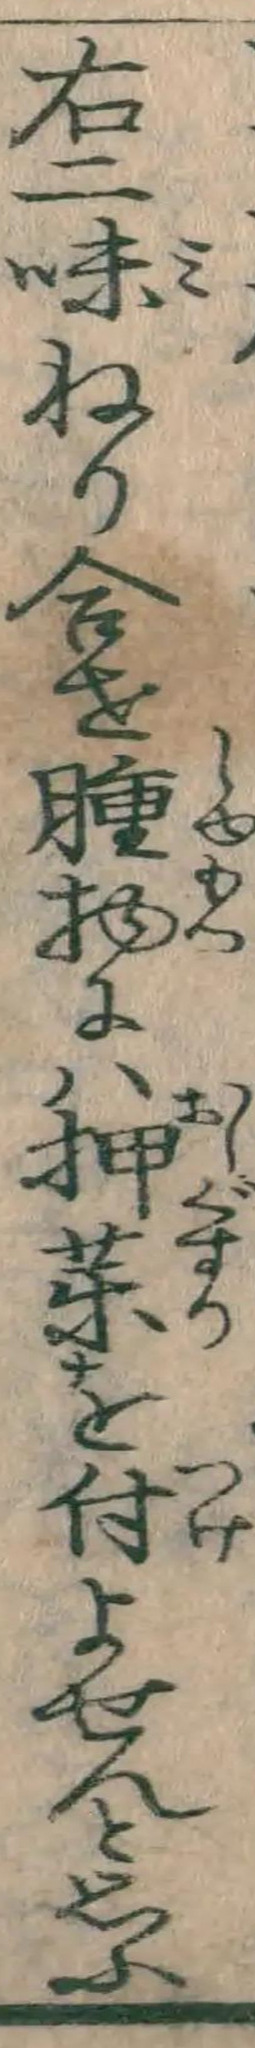右二味ねり合せ腫物には押薬を付よせんと思ふ

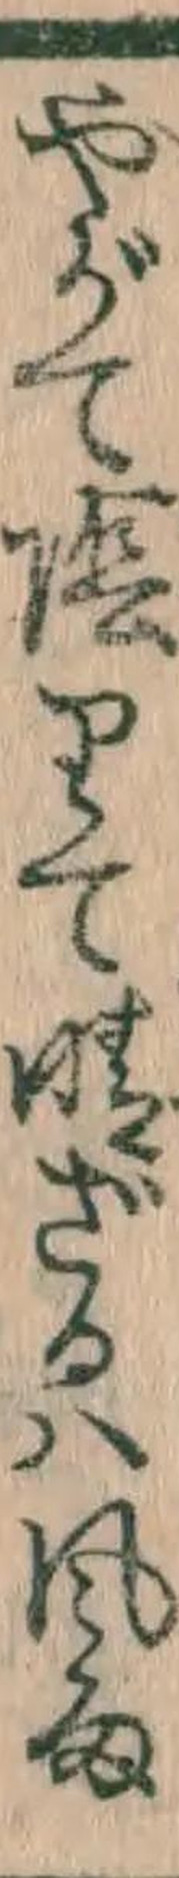やがて陰りて晴ざるは風雨
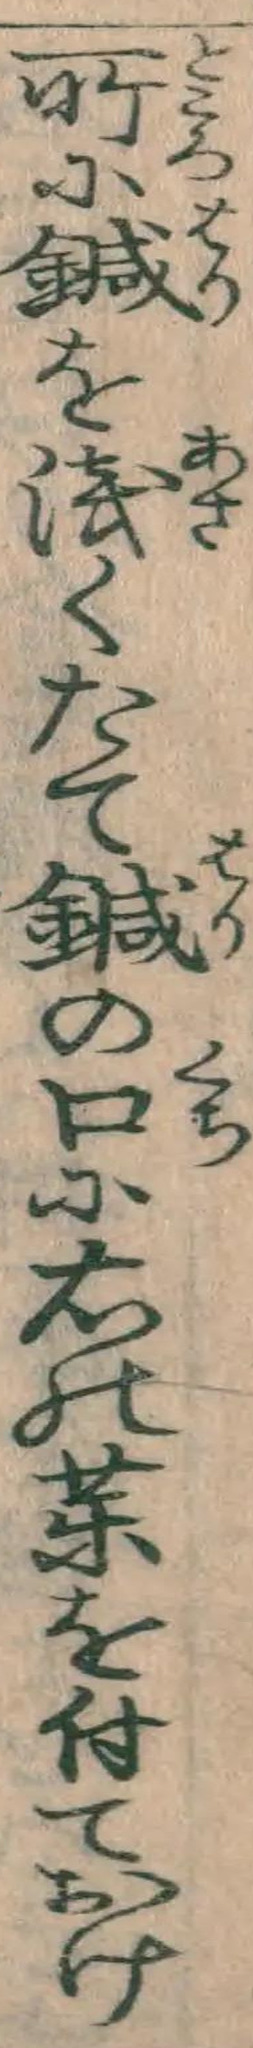所に鍼を浅くたて鍼の口に右の葉を付ておけ
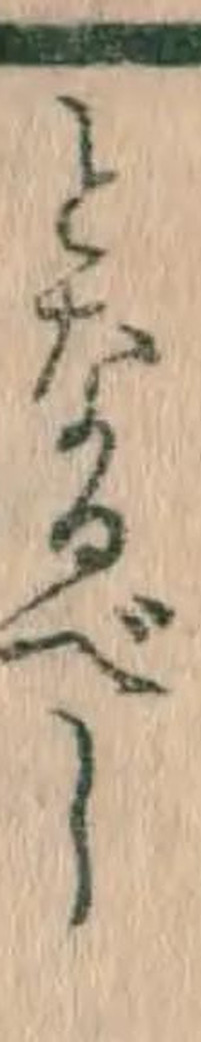となるべし
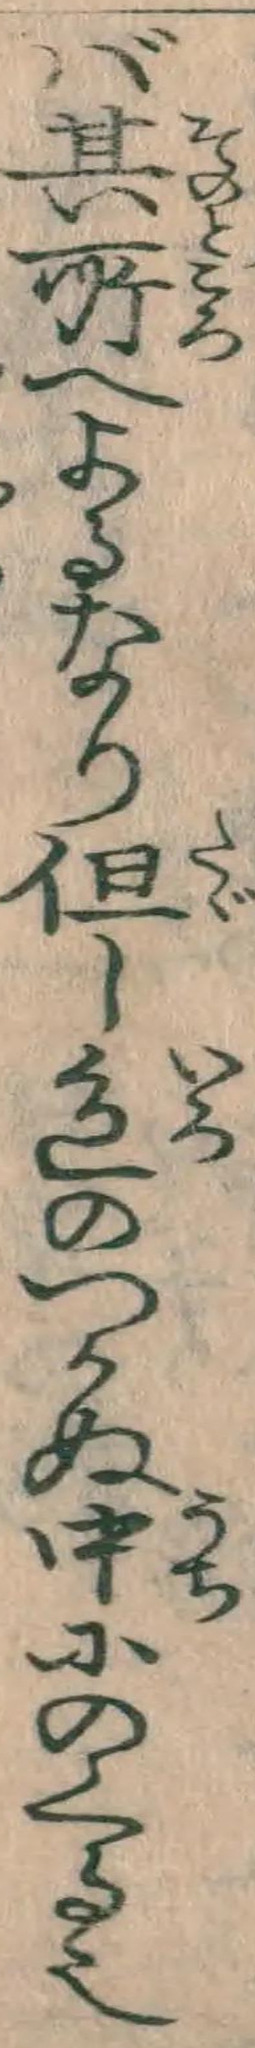ば其所へよるなり但し色のつかぬ中にのくる也
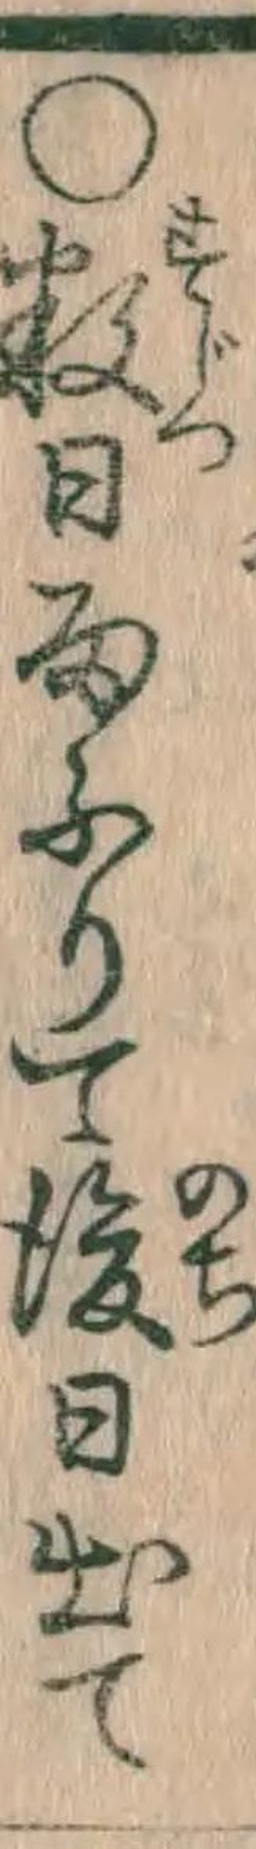○数日雨ふりて後日出て
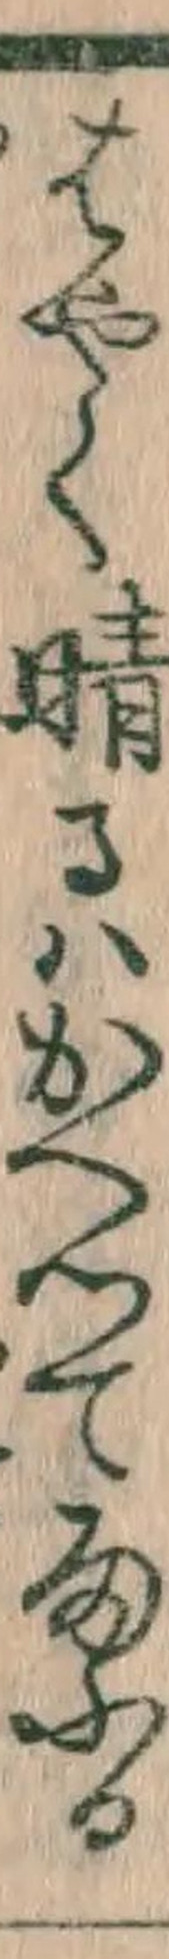はやく晴るはかへつて雨ふる
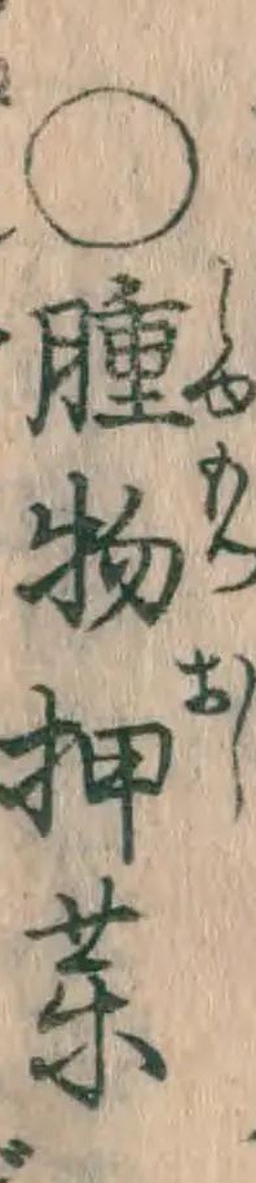○腫物押薬
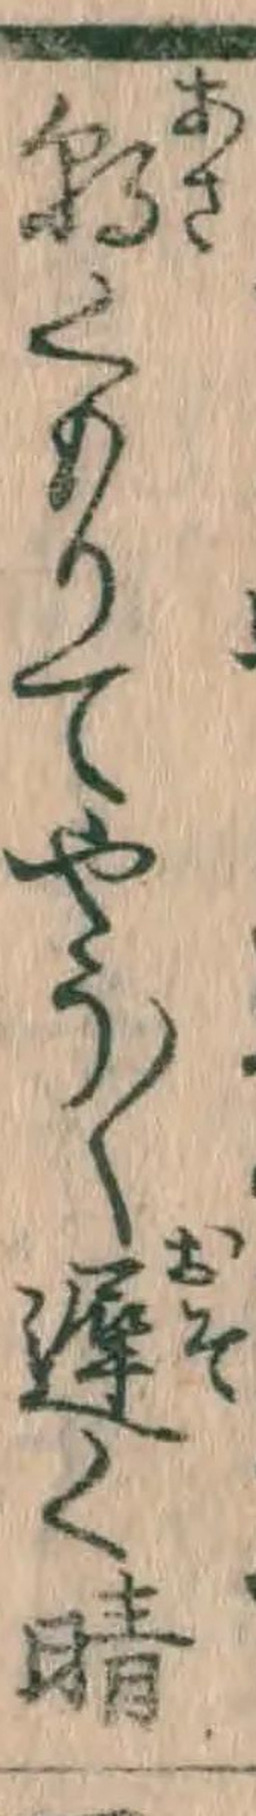朝くもりてやう〳〵遅く晴
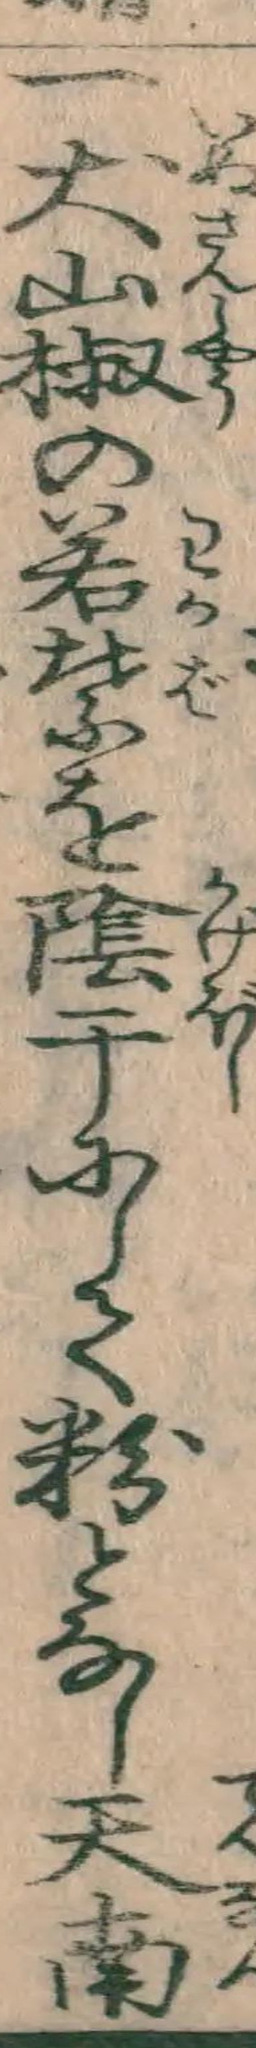一犬山椒の若葉を陰干にして粉となし天南
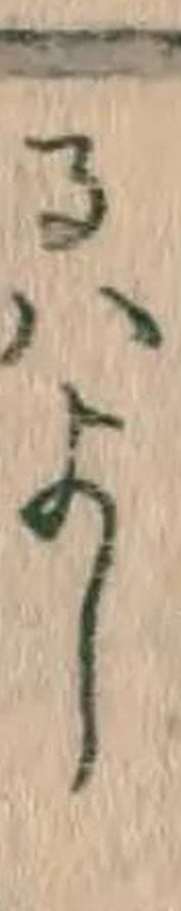るはよし
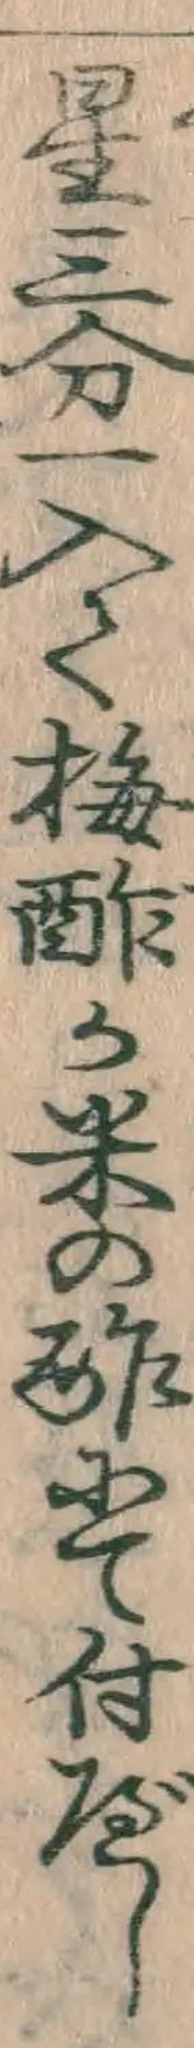星三分一入て梅酢か米の酢にて付べし
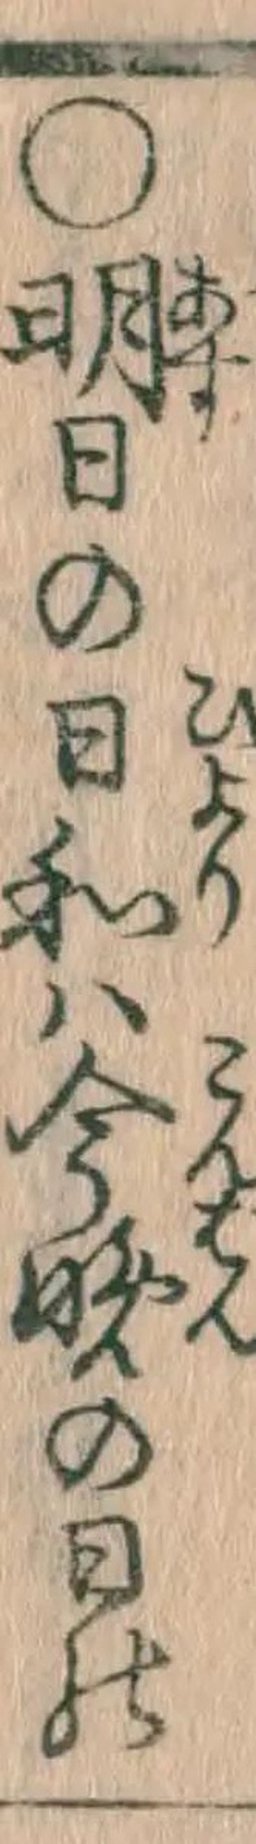○明日の日和は今晩の日の
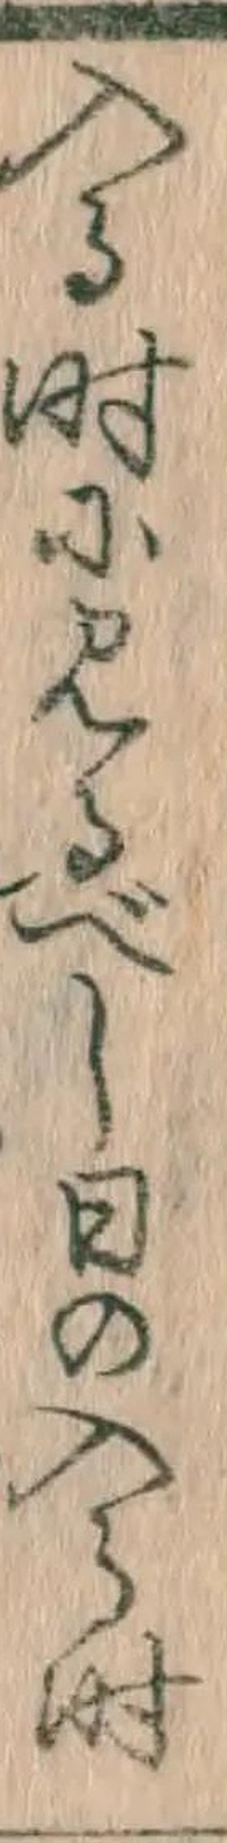入る時に見るべし日の入る時
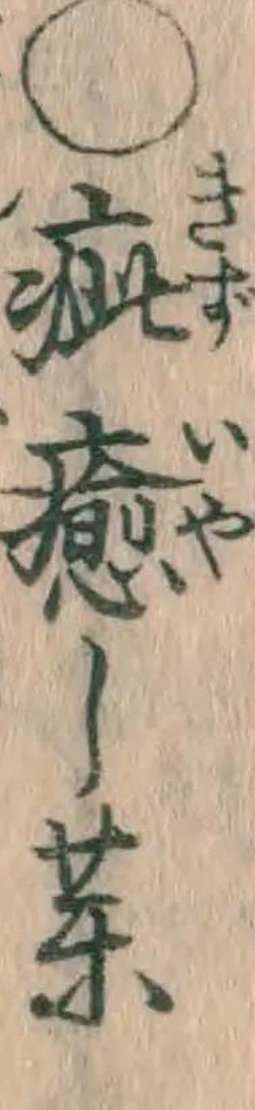○疵癒し薬
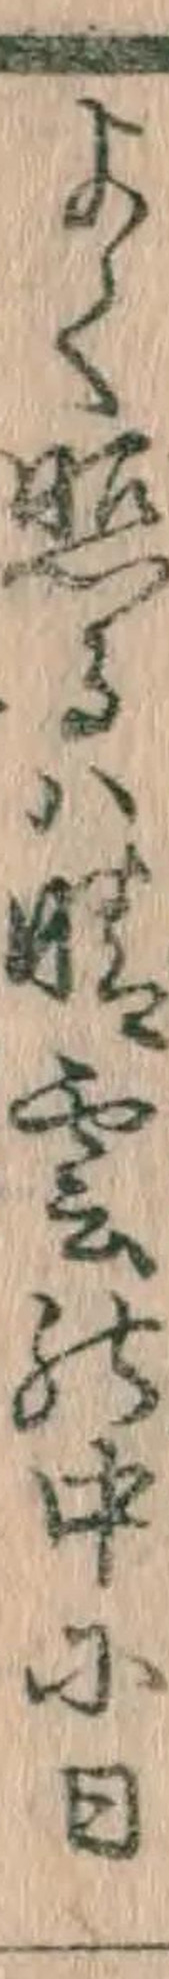よく照るは晴雲の中に日
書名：広益秘事大全 3巻. [3]
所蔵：国立国会図書館 National Diet Library, JAPAN
